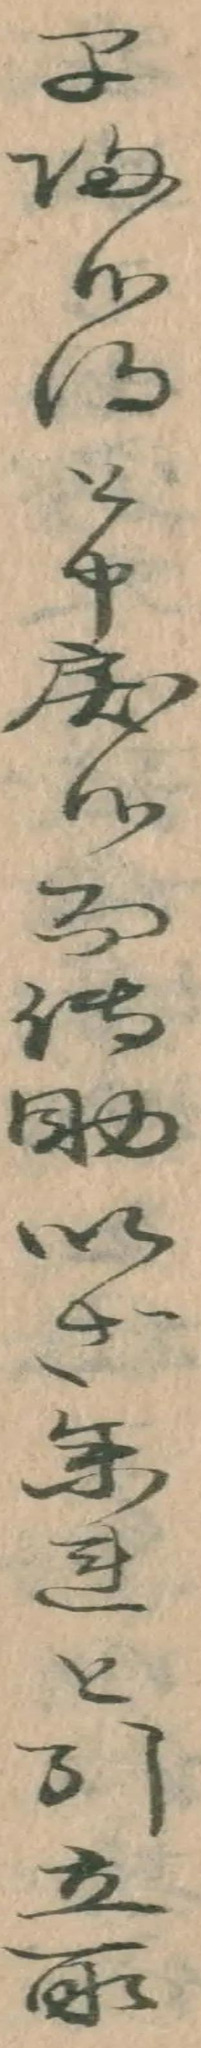早帰候得と申戻候而伝助いざ参れと引立取
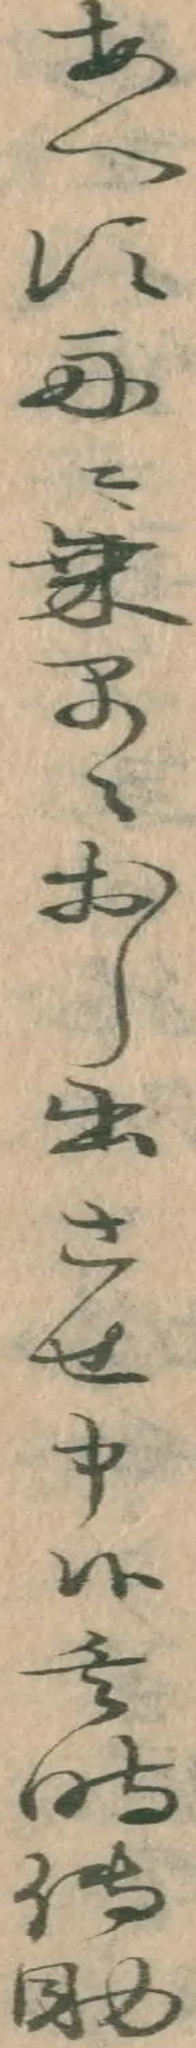あへす舟に乗早々おし出させ申候其時伝助
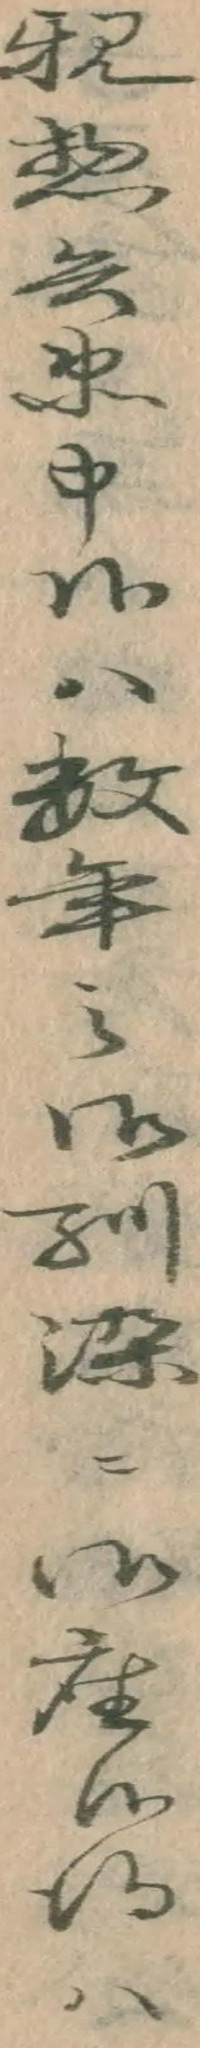親惣兵衛申候は数年之御馴染に御座候得は
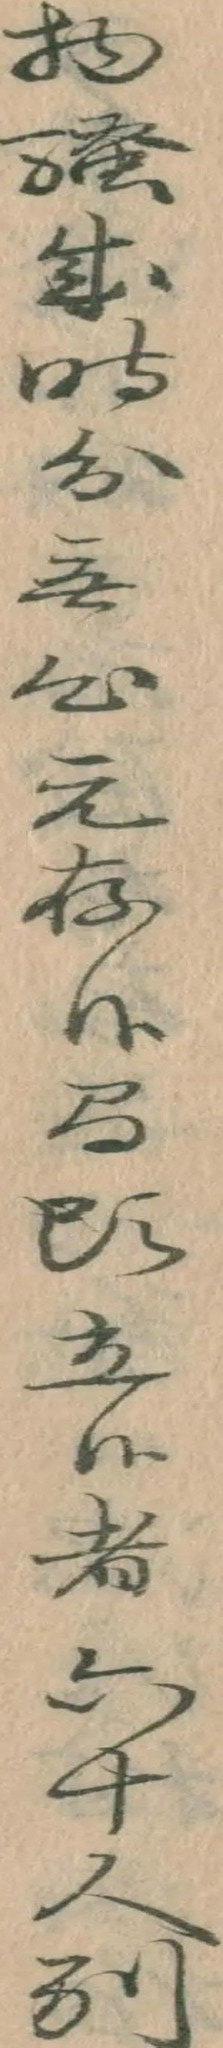物騒成時分無心元存候間頭立候者六十人別
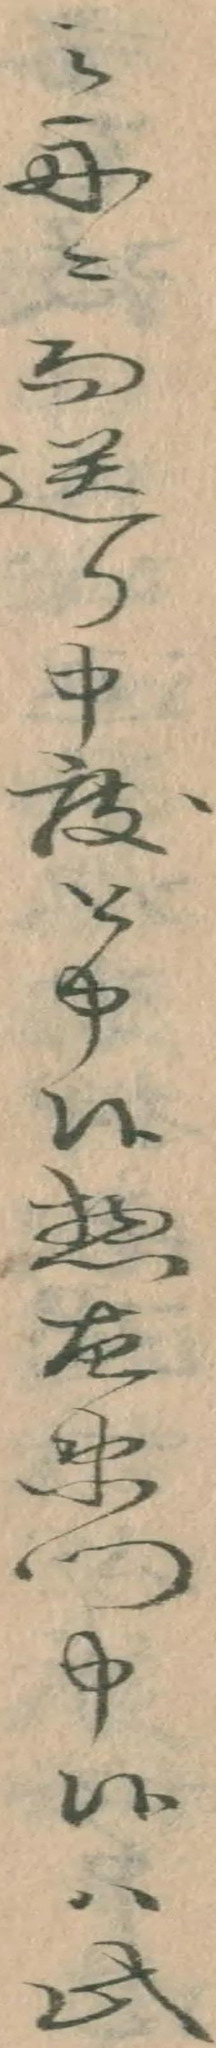之舟に而送り申度と申候惣左衛門申候は此
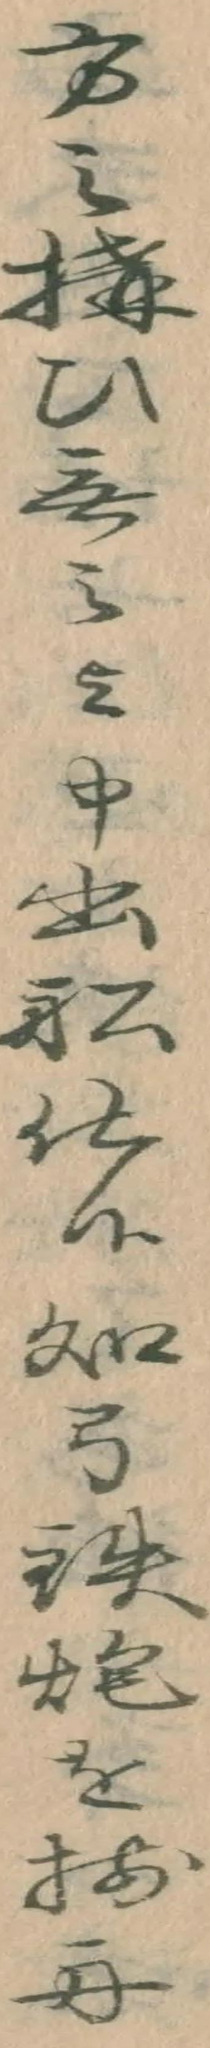方之構ひ無之与申出船仕候処弓鉄炮を揃舟
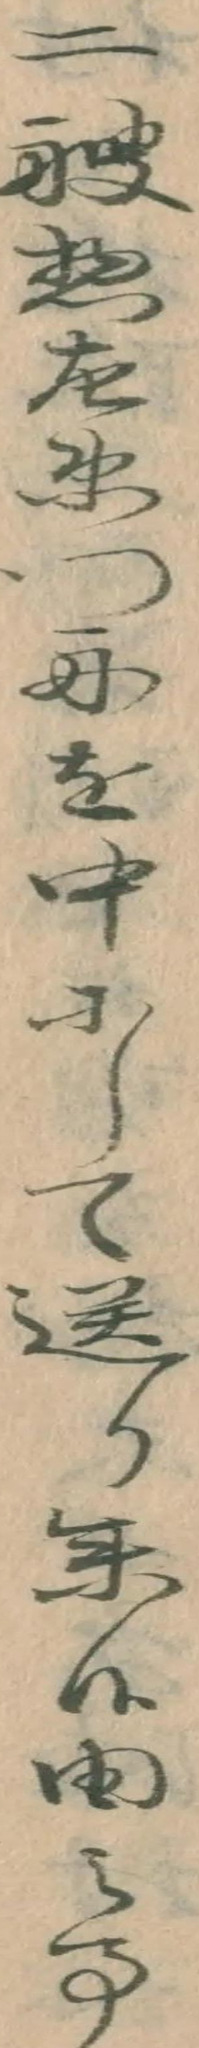二艘惣左衛門舟を中にして送り乗候由之事
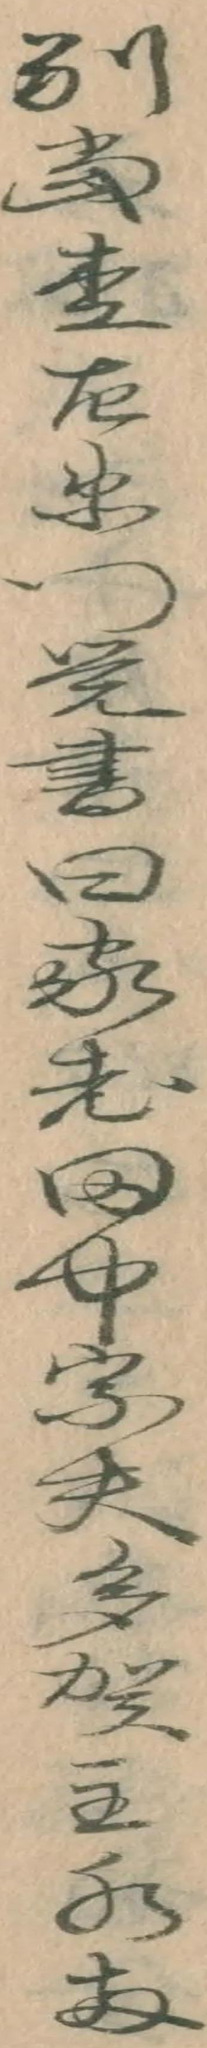別当杢左衛門覚書日家老田中宗夫多賀主水両

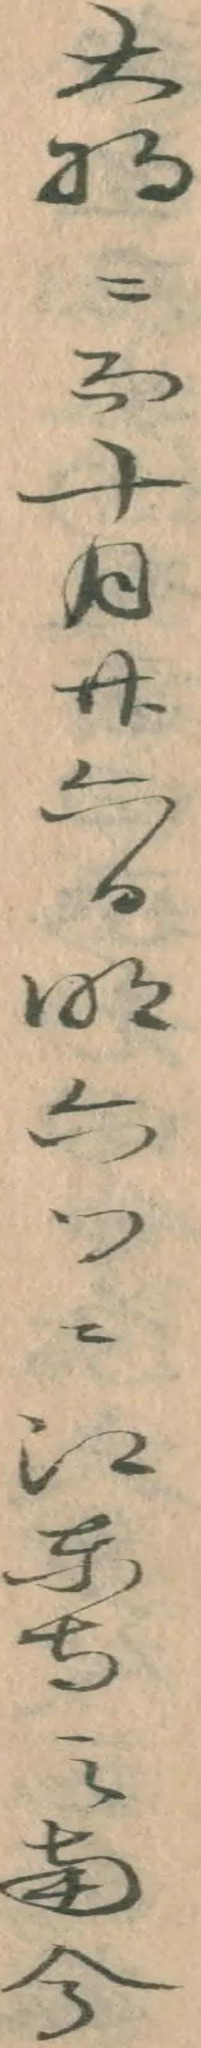大将に而十月廿六日明六つに江東寺之南今
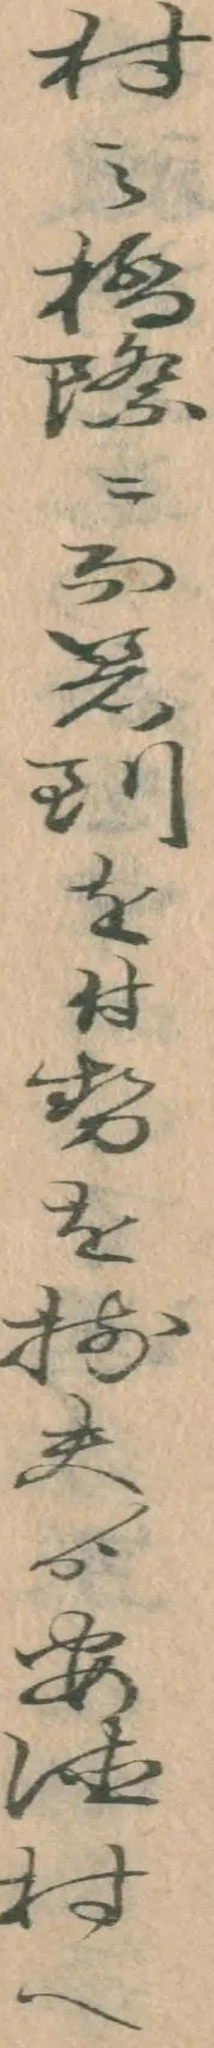村之橋際に而着到を付勢を揃夫ゟ安徳村へ
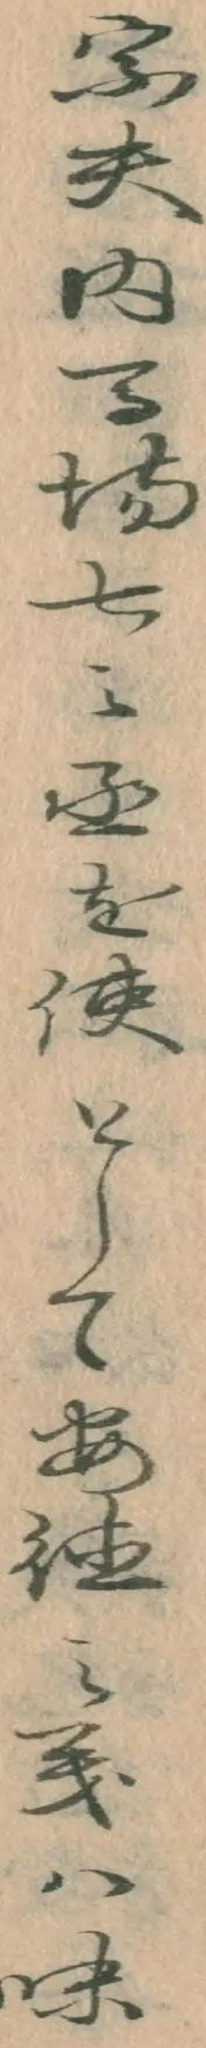宗夫内馬場七之丞を使として安徳之義は味
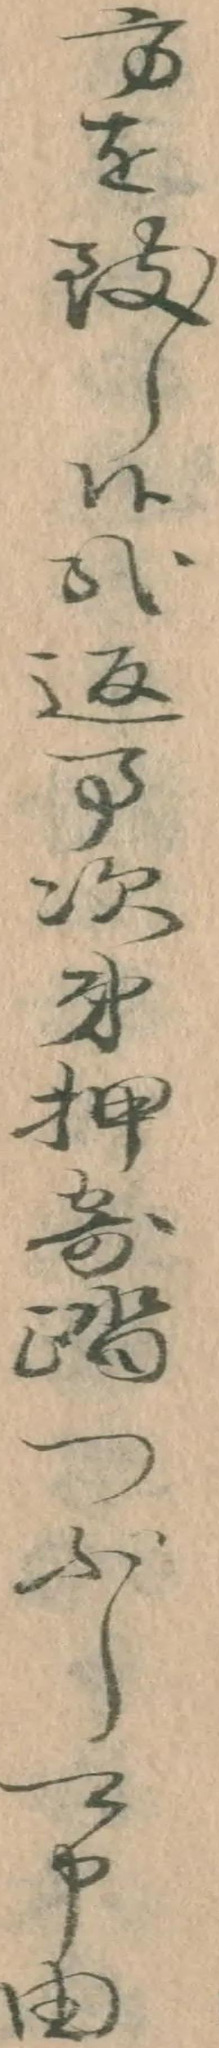方を致し候哉返事次第押寄踏つぶし可申由
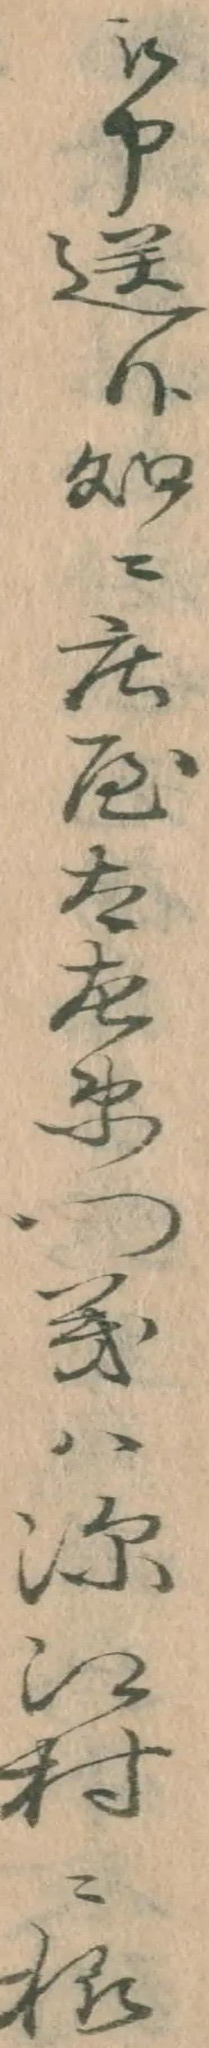被申送候処に庄屋太左衛門義は深江村に様
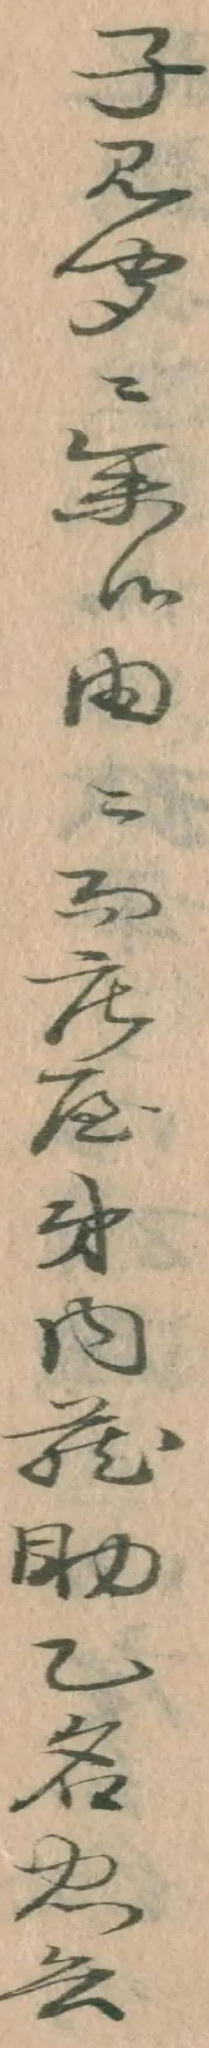子見聞に参候由に而庄屋弟内蔵助乙名忠兵
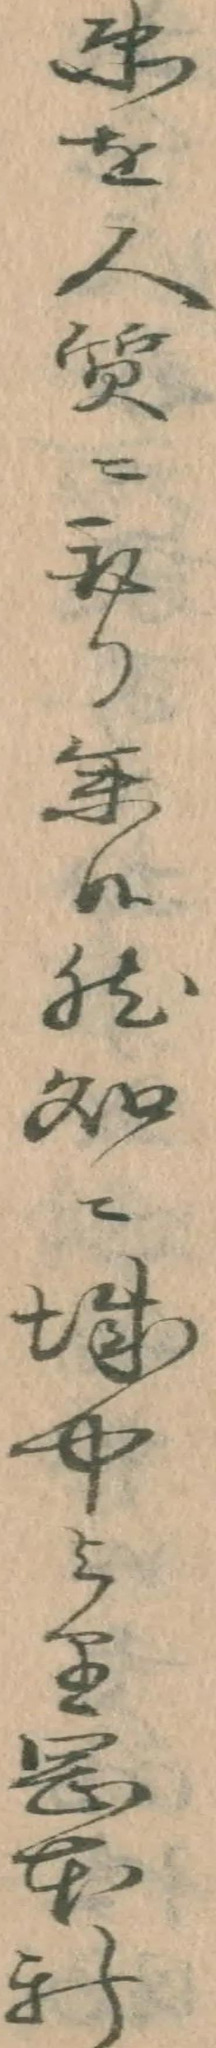衛を人質に取り参候然処に城中より岡本新
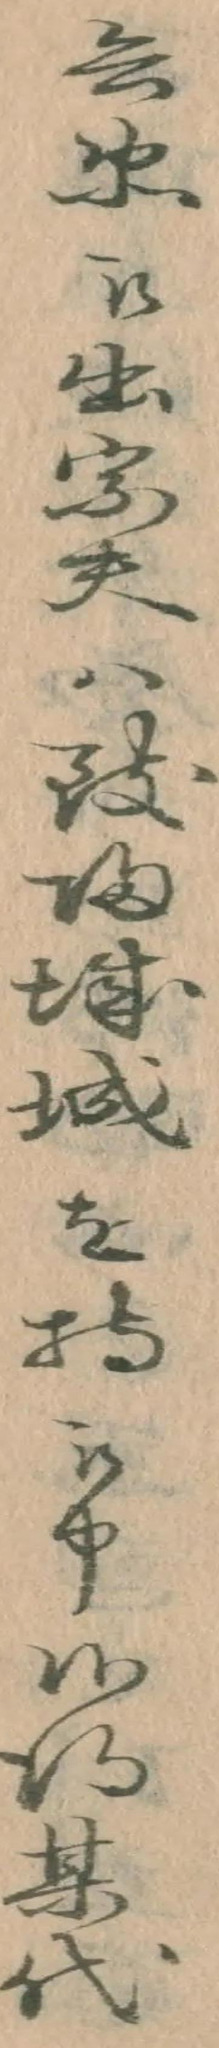兵衛被出宗教夫は致帰城城を持被申候得某代
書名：切支丹御退治記 49巻. [1]
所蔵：国立国会図書館 National Diet Library, JAPAN
